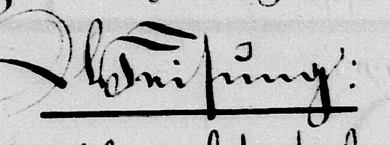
Weisung:
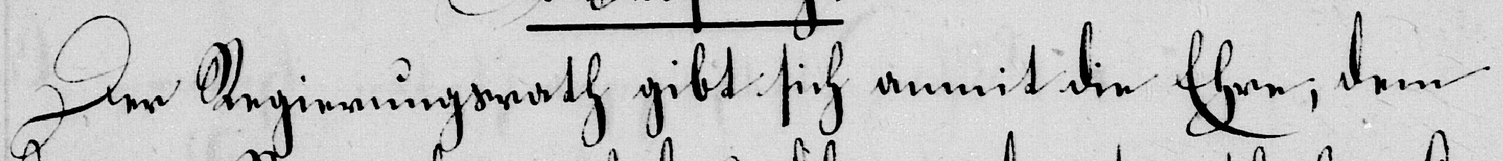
Der Regierungsrath gibt sich anmit die Ehre; dem
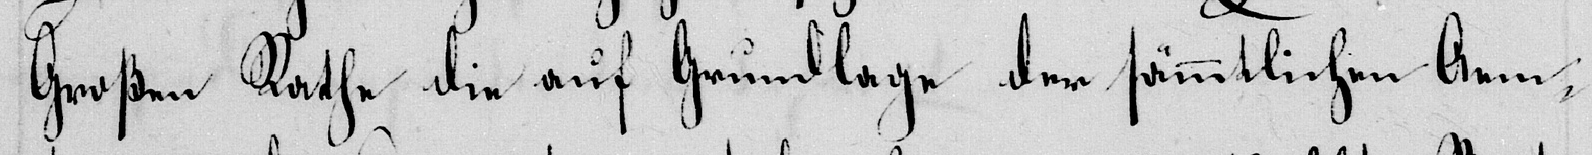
Großen Rathe die auf Grundlage der sämmtlichen Aem¬
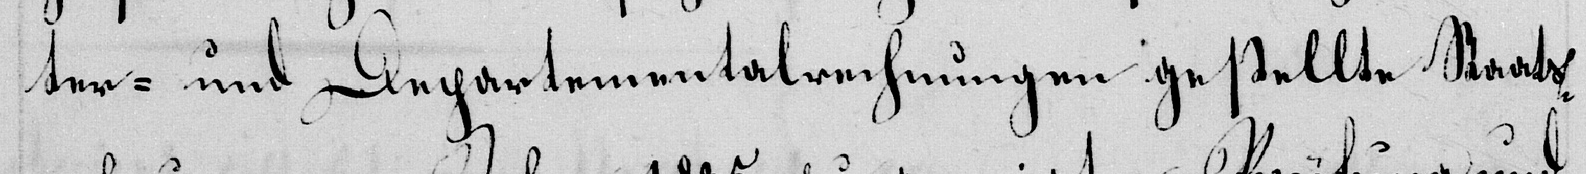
ter- und Departementalrechnungen gestellte Staats¬
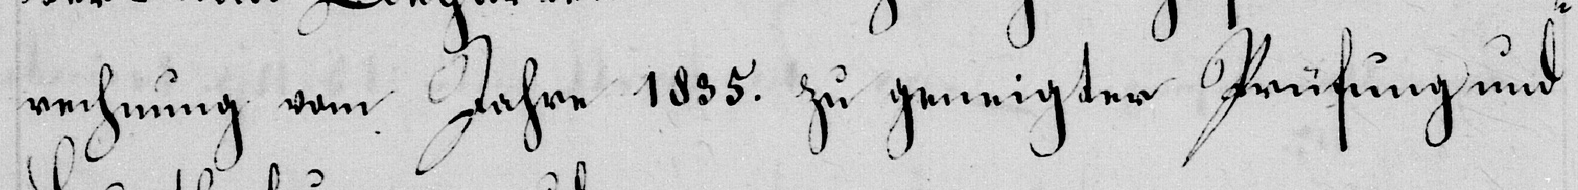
rechnung vom Jahre 1835. zu geneigter Prüfung und
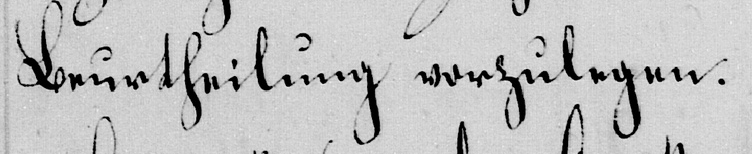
Beurtheilung vorzulegen.
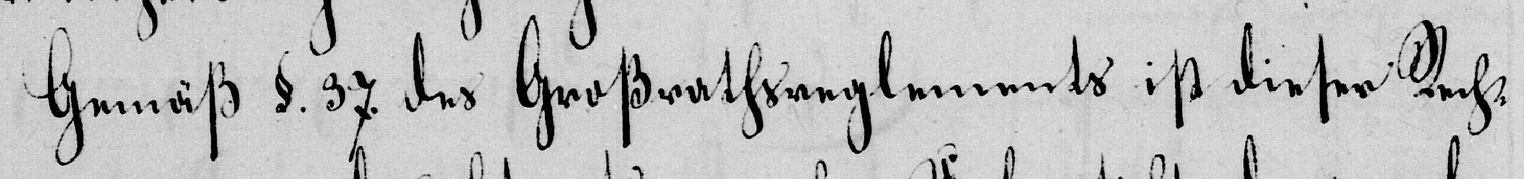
Gemäß §. 37. des Großrathsreglements ist dieser Rech¬
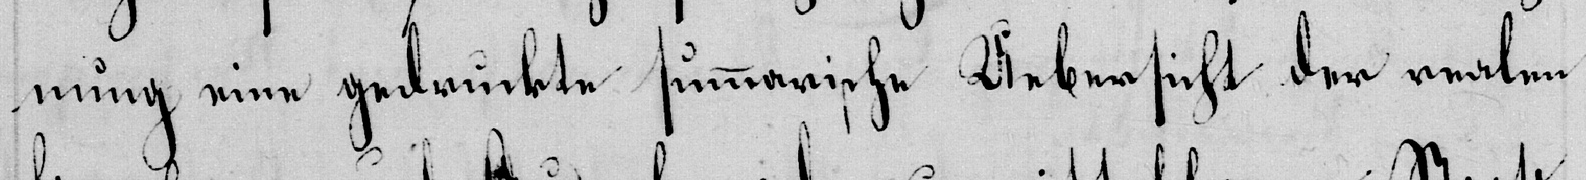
nung eine gedruckte summarische Uebersicht der realen
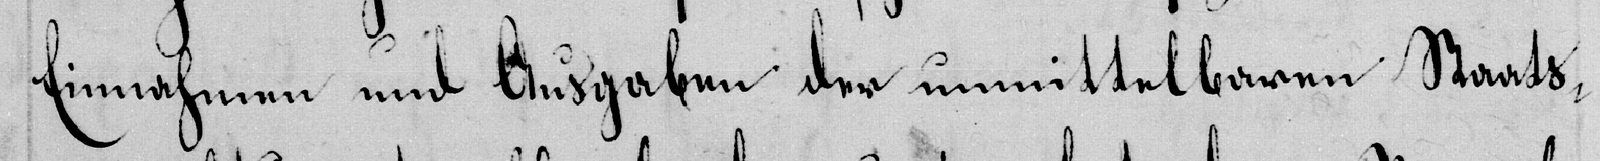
Einnahmen und Ausgaben der unmittelbaren Staats¬
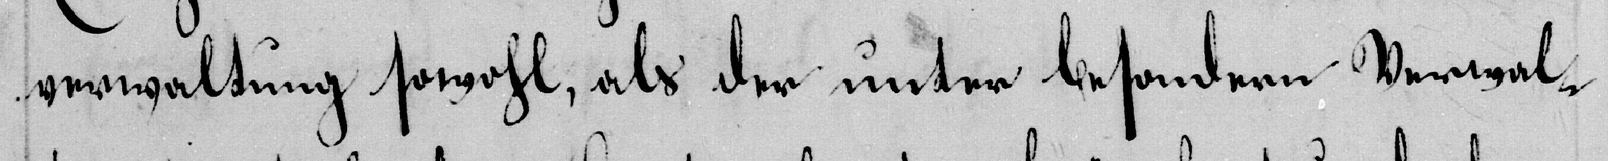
verwaltung sowohl, als der unter besondern Verwal¬
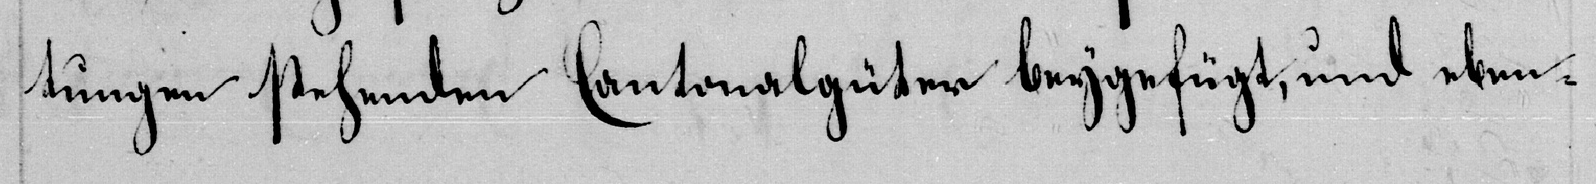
tungen stehenden Cantonalgüter beygefügt, und eben-
